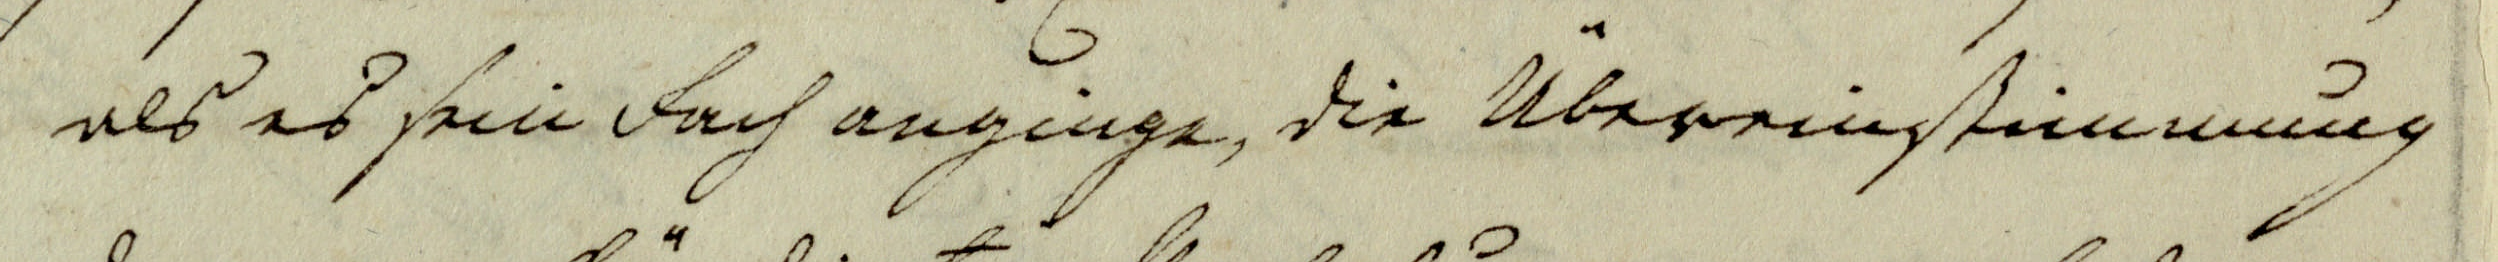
als es sein Fach anginge, die Übereinstimmung
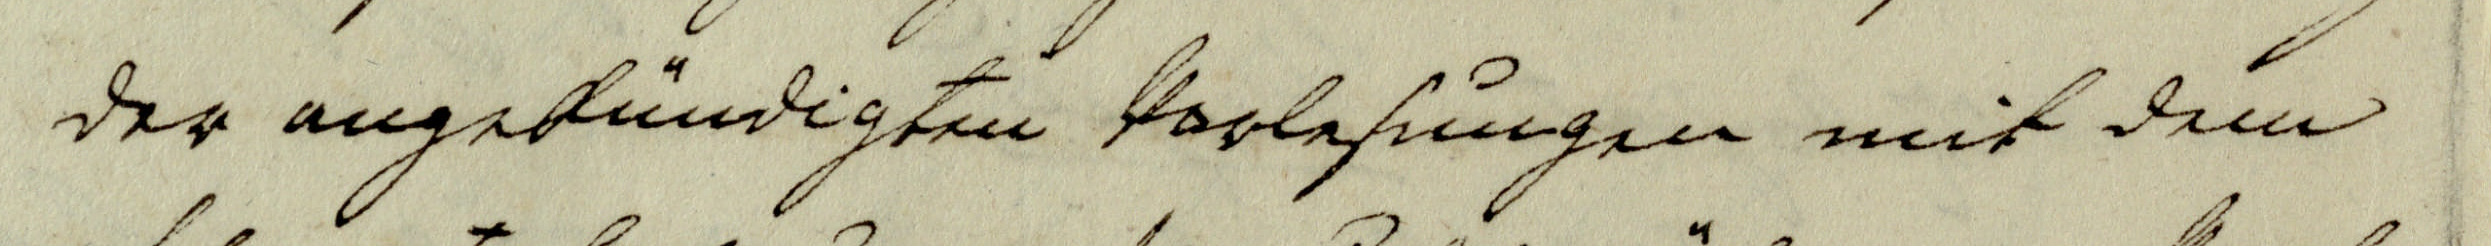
der angekündigten Vorlesungen mit dem
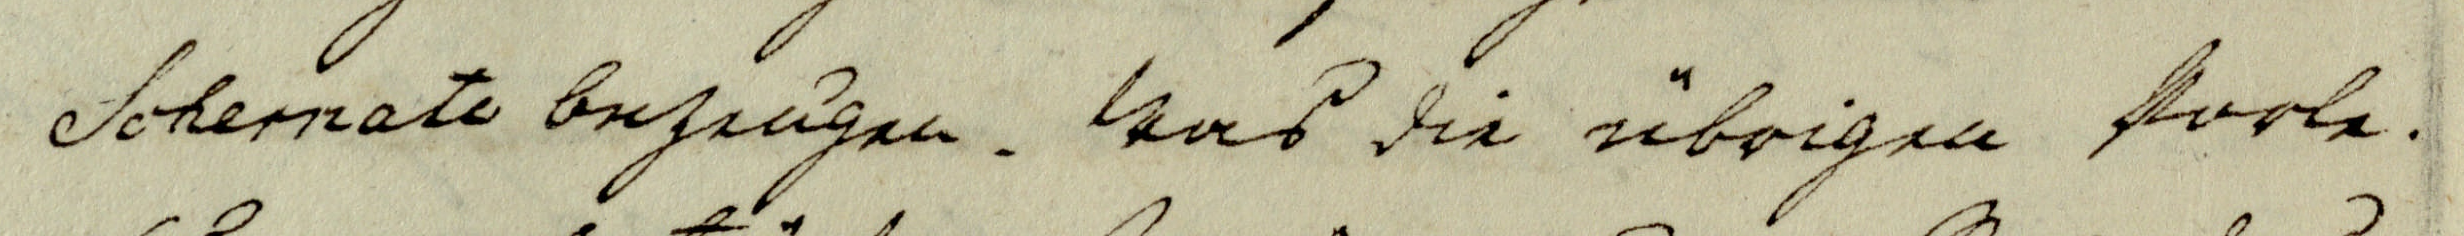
Schemate bezeugen. Was die übrigen Vorle¬
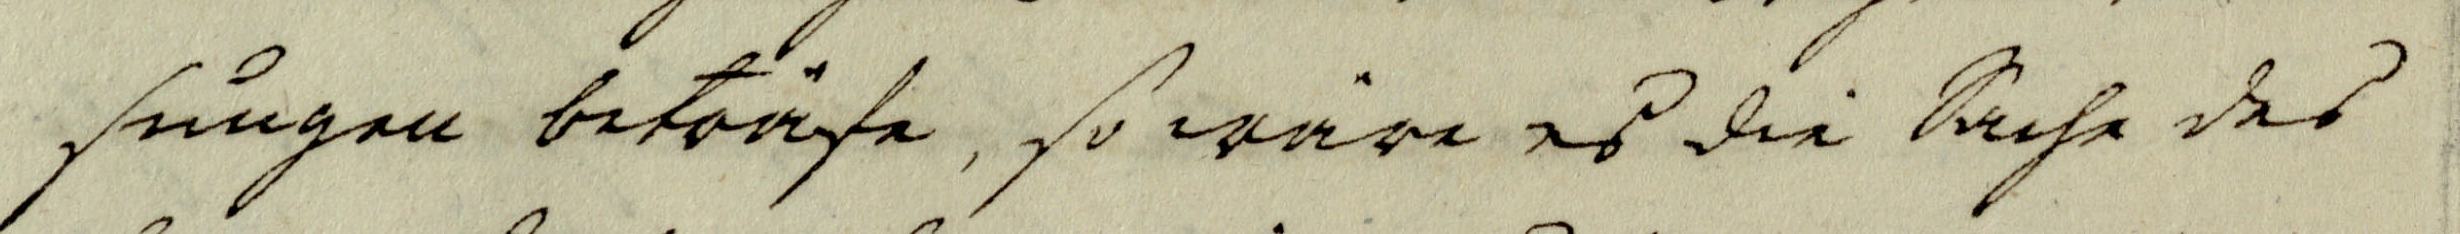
sungen beträfe, so wäre es die Sache des
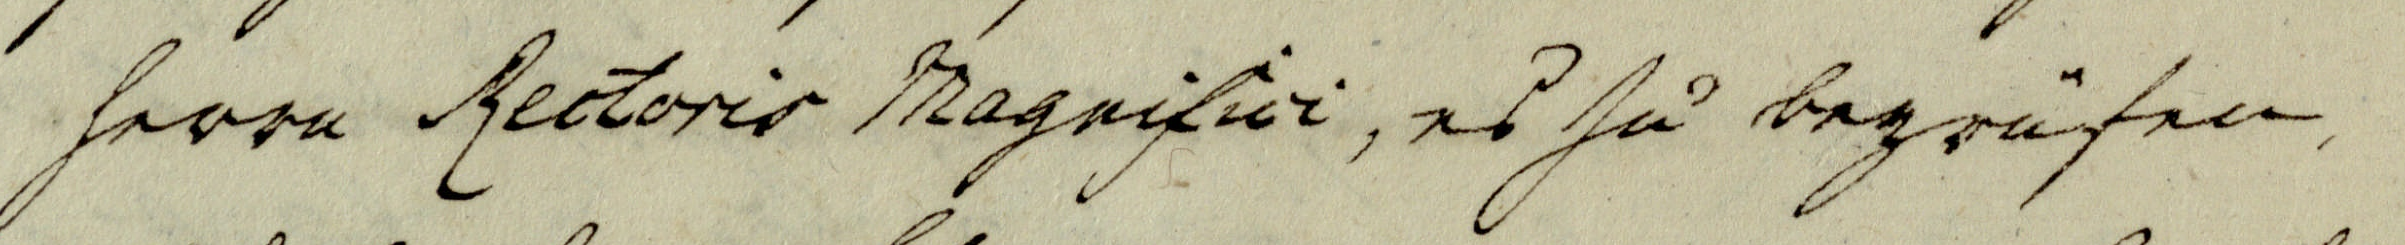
Herrn Rectoris Magnifici, es zu beprüfen,
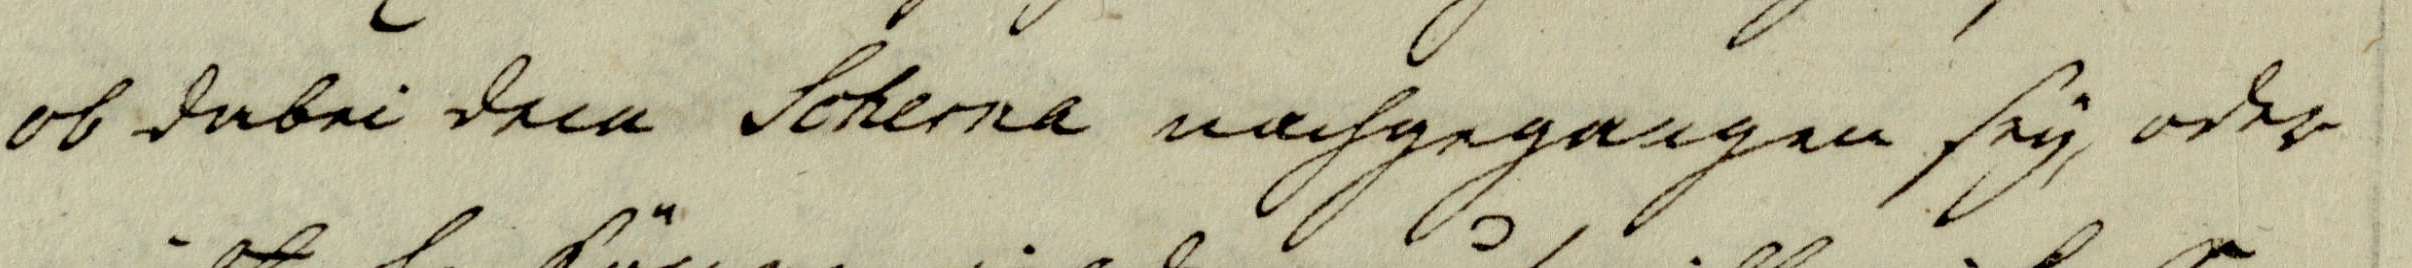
ob dabei dem Schema nachgegangen seÿ, oder
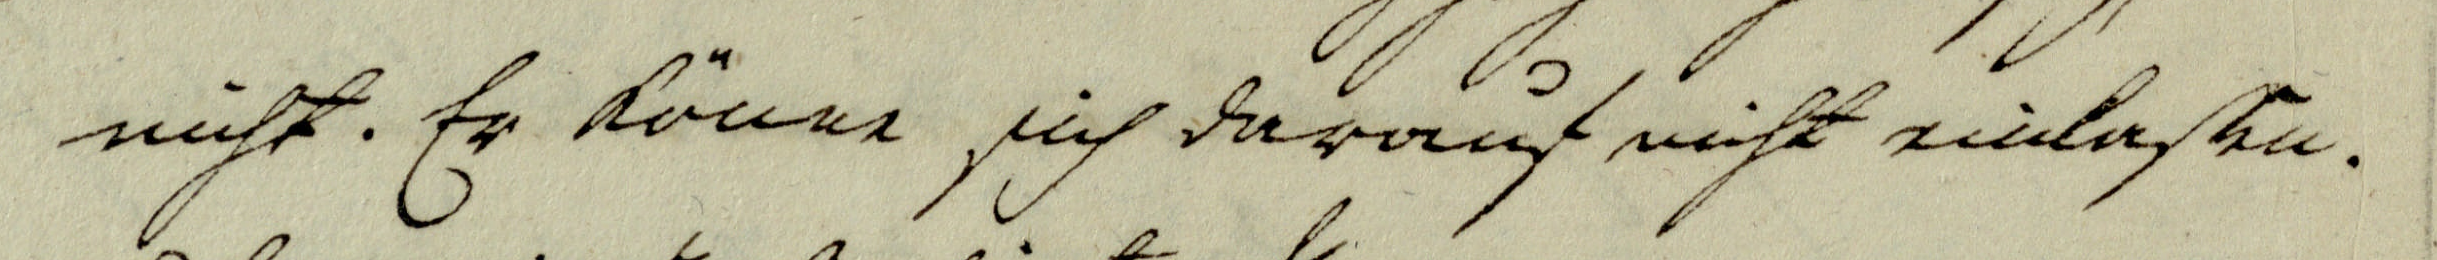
nicht. Er könne sich darauf nicht einlassen.
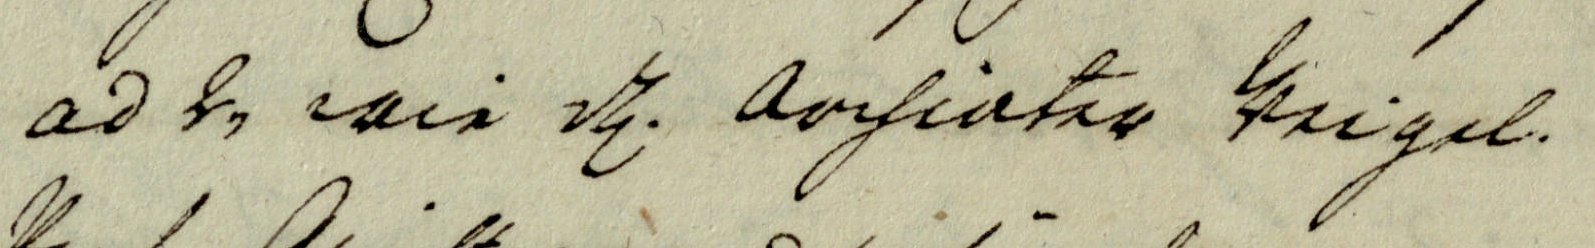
ad 2., wie dh. Archiater Weigel.
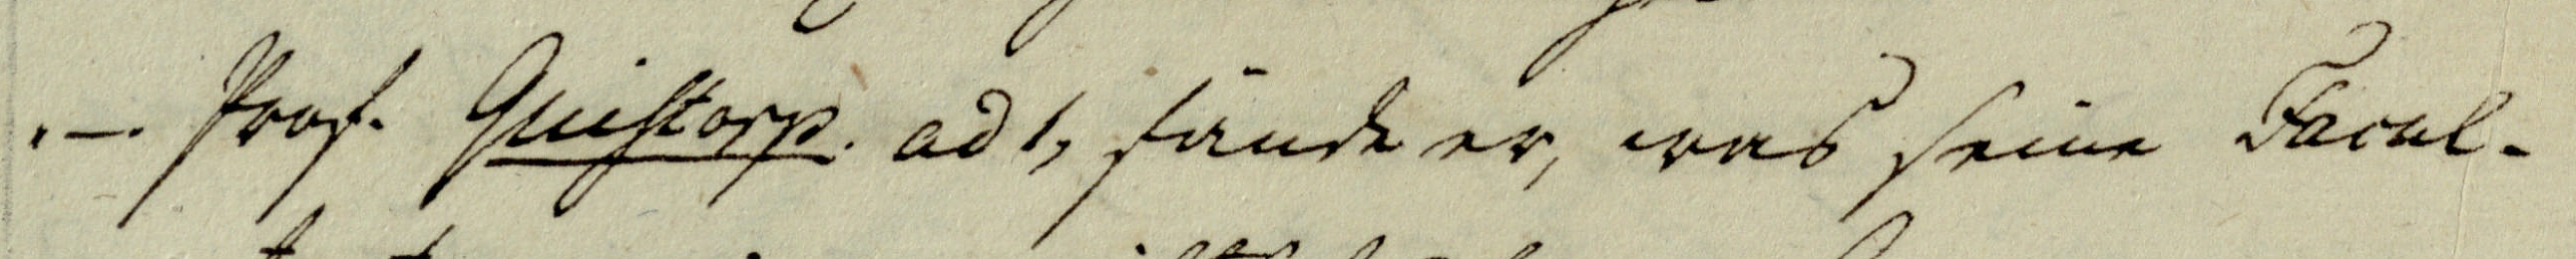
Prof. Quistorp. ad 1., fände er, was seine Facul¬
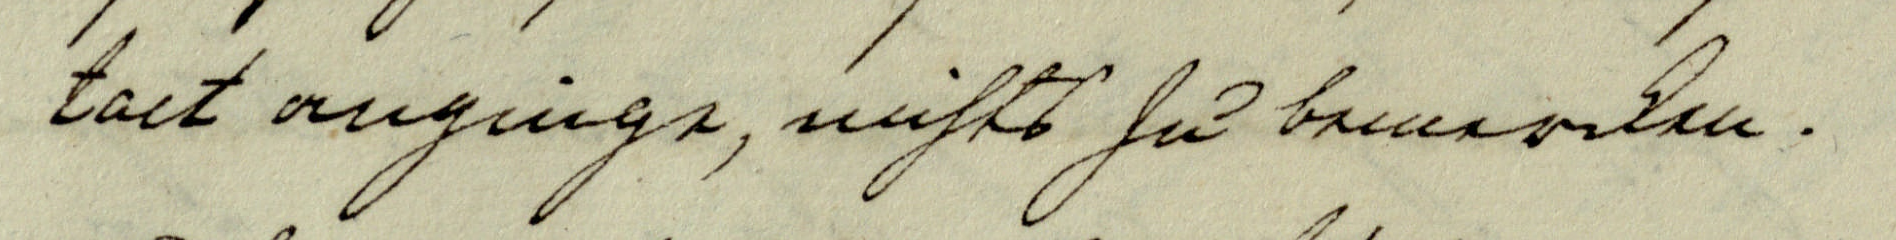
taet anginge, nichts zu bemercken.
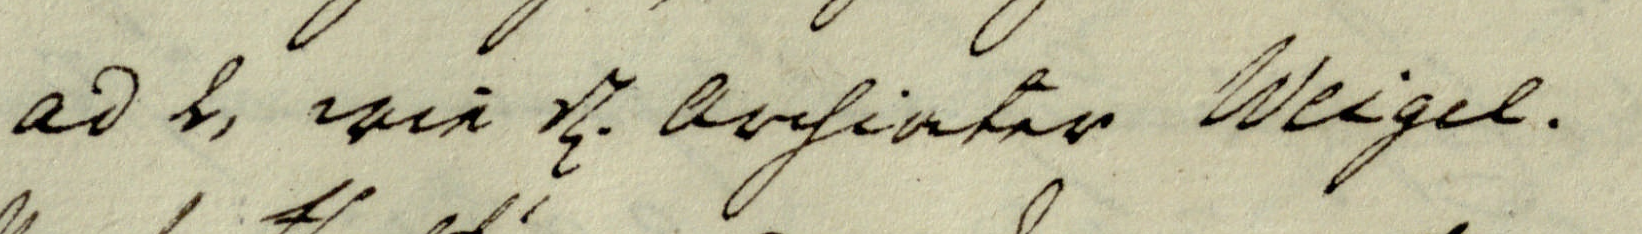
ad 2, wie dh. Archiater Weigel.
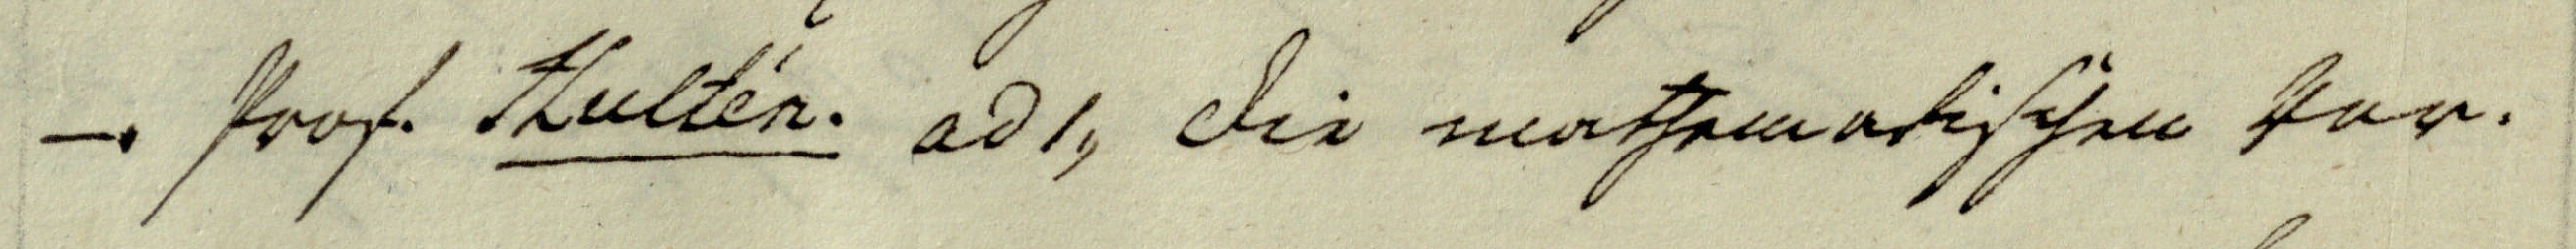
Prof. Hultén. ad 1., Die mathematischen Vor¬
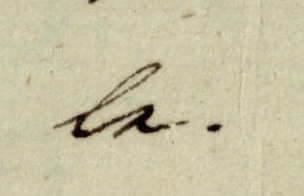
le¬
